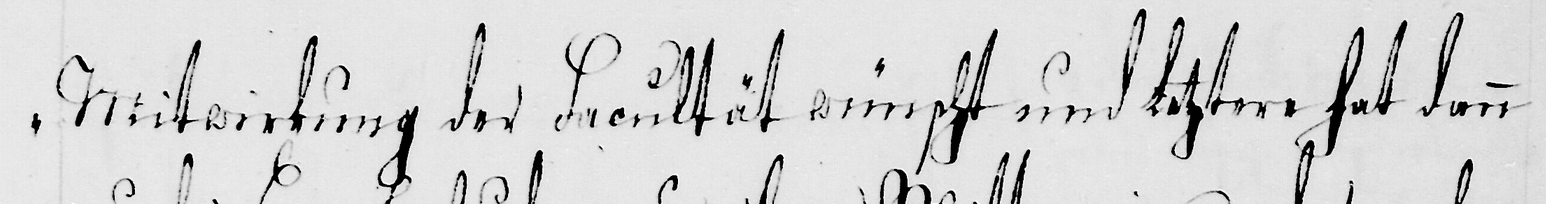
Mitwirkung der Facultät wünscht und Letzere hat dan¬
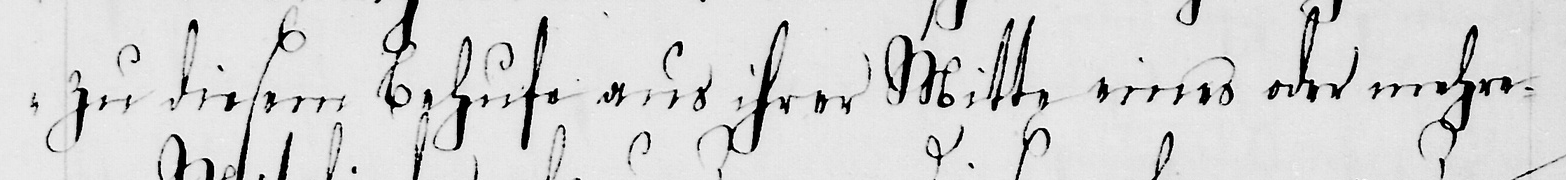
n zu diesem Behufe aus ihrer Mitte eines oder mehr¬
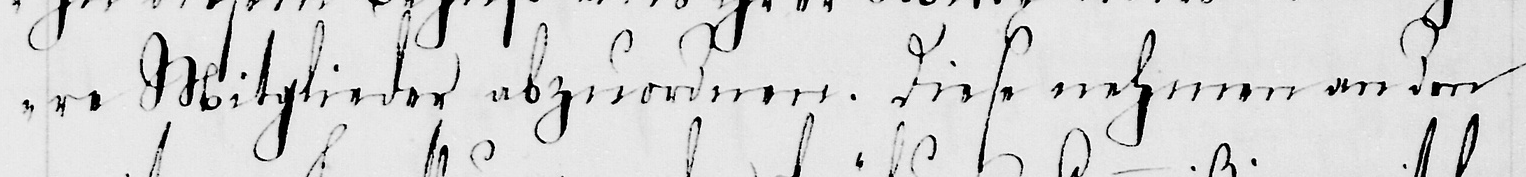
ere Mitglieder abzuordnen. Diese nehmen an den
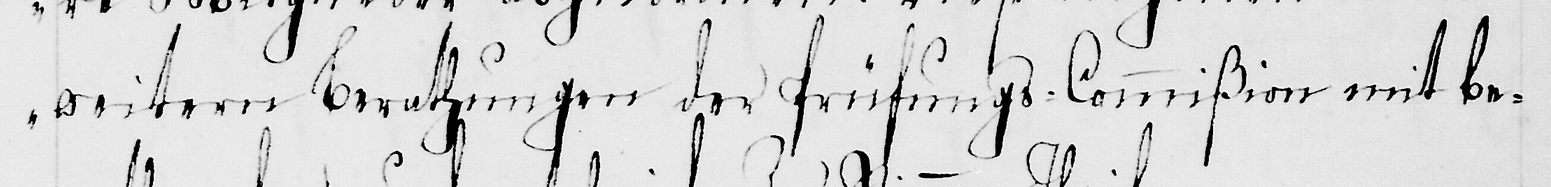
weitern Berathungen der Prüfungs-Commißion mit be¬
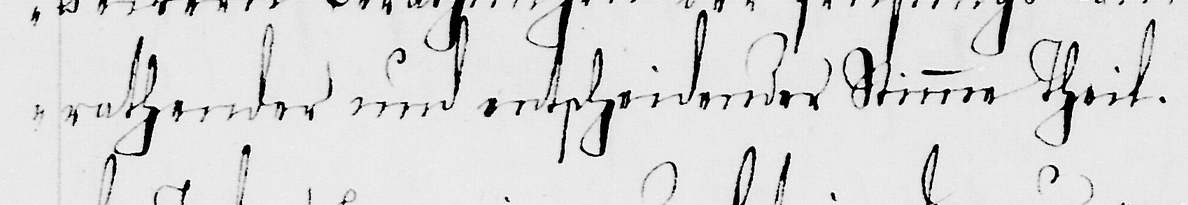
rathender und entscheidender Stimme Theil.
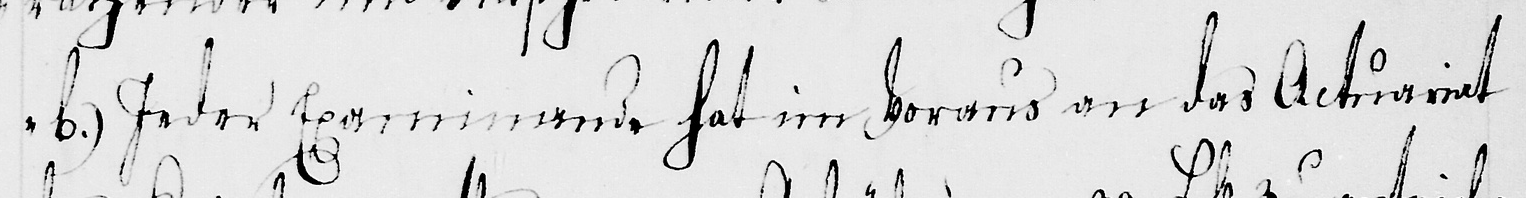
b.) Jeder Examinande hat im Voraus an das Actuariat
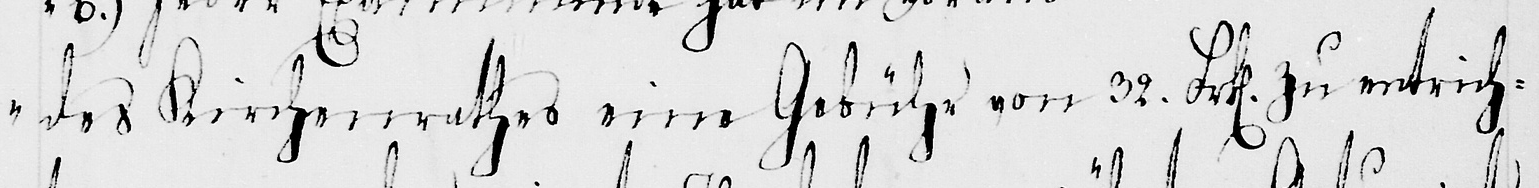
des Kirchenrathes eine Gebühr von 32. Frk[en] zu entrich¬
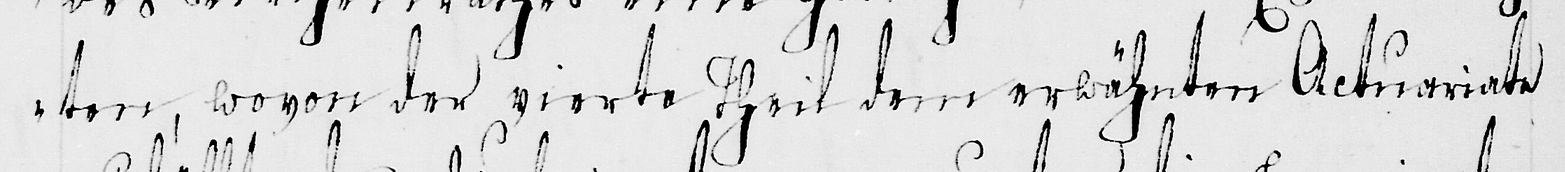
ten, wovon der vierte Theil dem erwähnten Actuariate
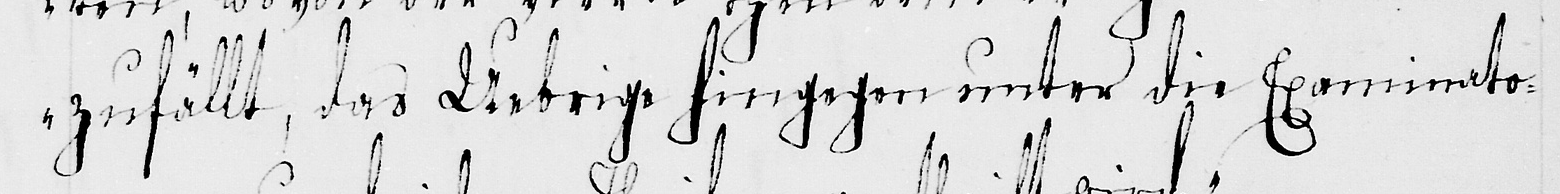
zufällt, das Uebrige hingegen unter die Examinato¬
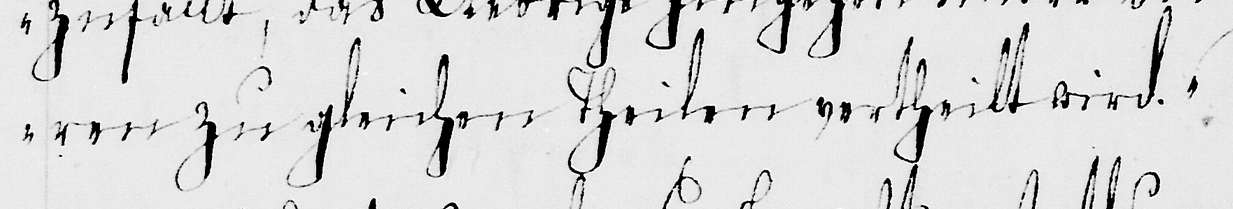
ren zu gleichen Theilen vertheilt wird.“
